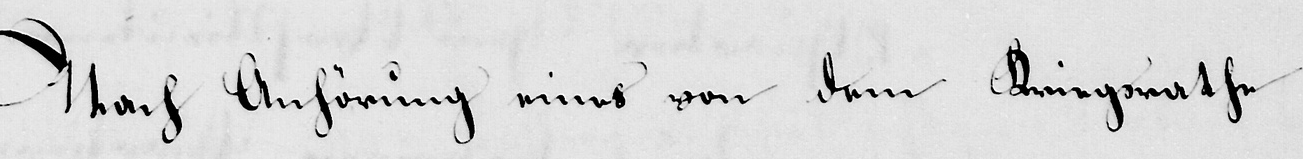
Nach Anhörung eines von dem Kriegsrathe
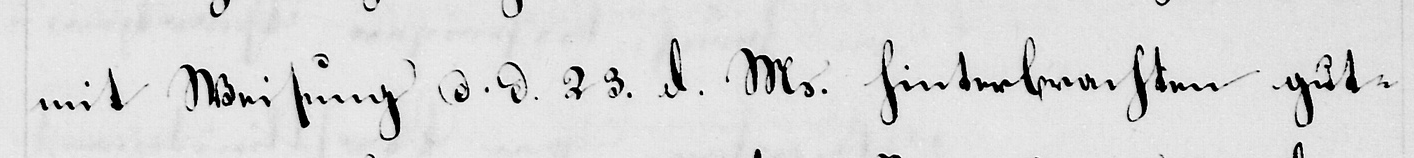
mit Weisung d. d. 23. d. Ms. hinterbrachten gut¬
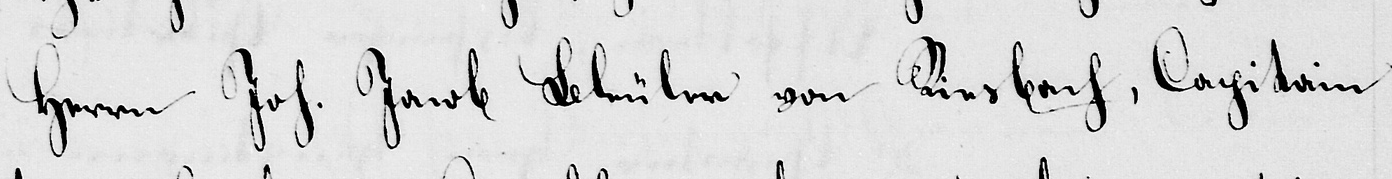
Herrn Joh. Jacob Bleuler von Riesbach, Capitain
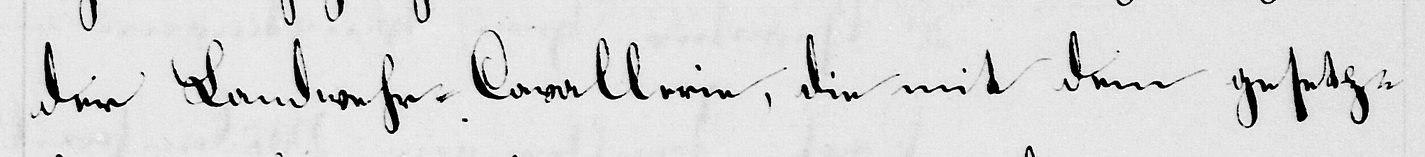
der Landwehr-Cavallerie, die mit dem gesetz¬
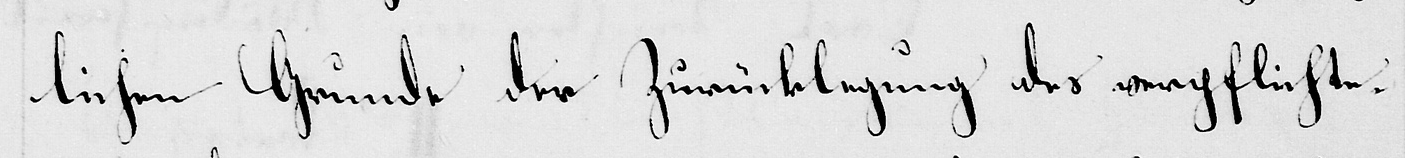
lichen Grunde der Zurücklegung des verpflichte¬
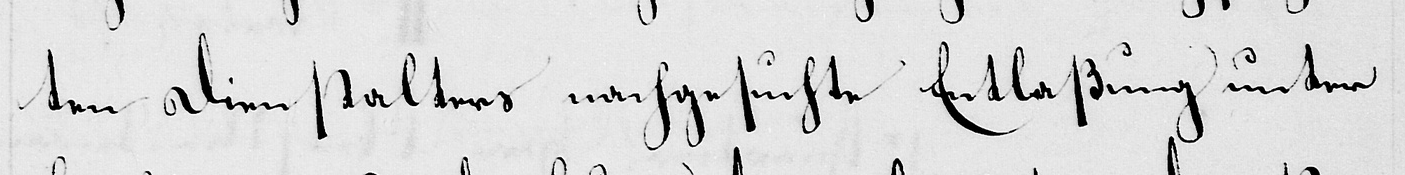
ten Dienstalters nachgesuchte Entlaßung unter
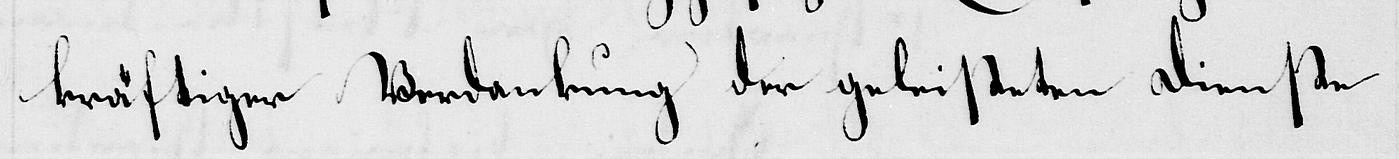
kräftiger Verdankung der geleisteten Dienste
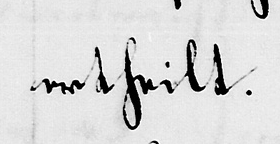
ertheilt.
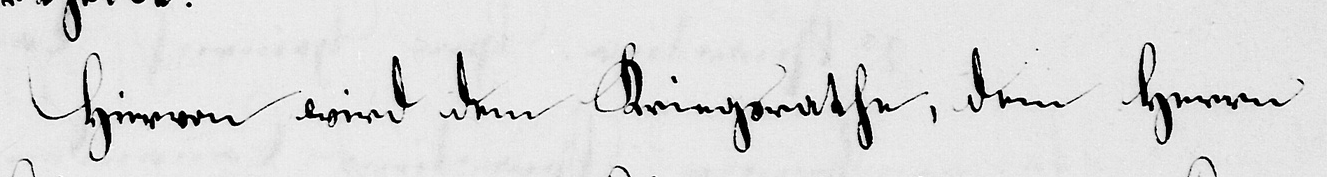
Hiervon wird dem Kriegsrathe, dem Herrn
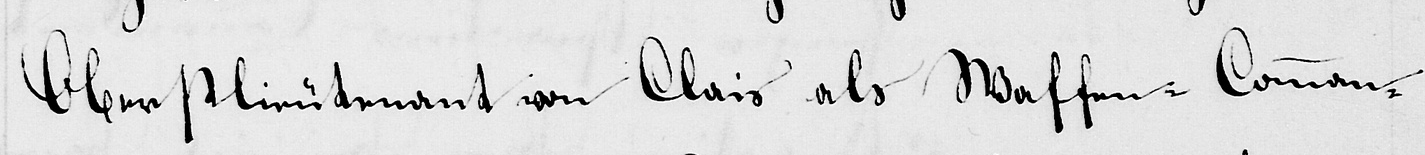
Oberstlieutenant von Clais als Waffen-Comman¬
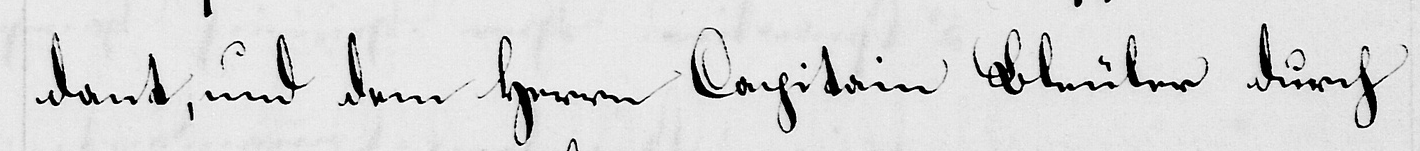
dant, und dem Herrn Capitain Bleuler durch
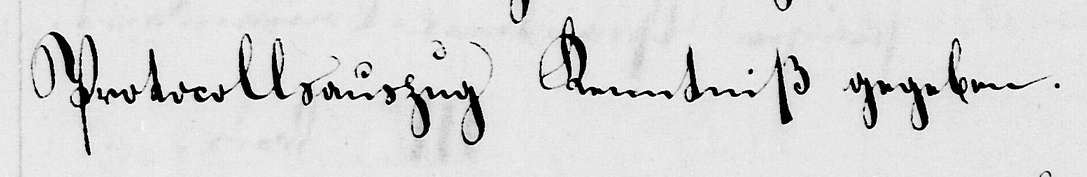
Protocollsauszug Kenntniß gegeben.
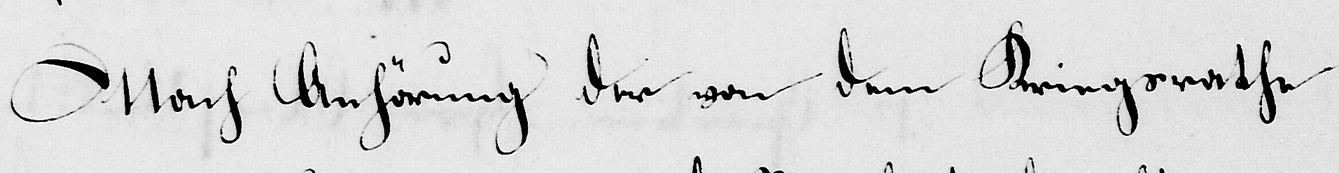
Nach Anhörung der von dem Kriegsrathe
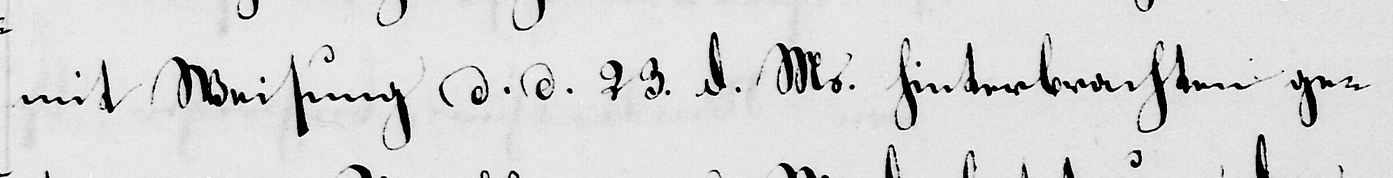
mit Weisung d. d. 23. d. Ms. hinterbrachten ge¬
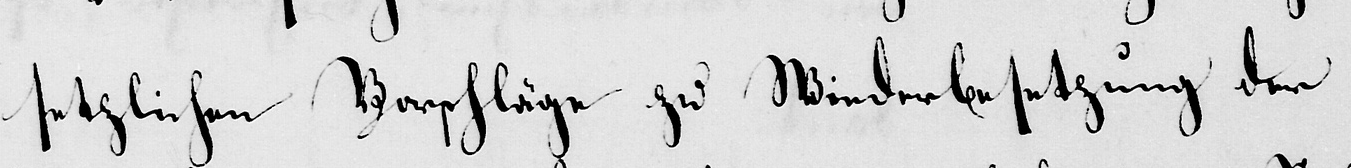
setzlichen Vorschläge zu Wiederbesetzung der
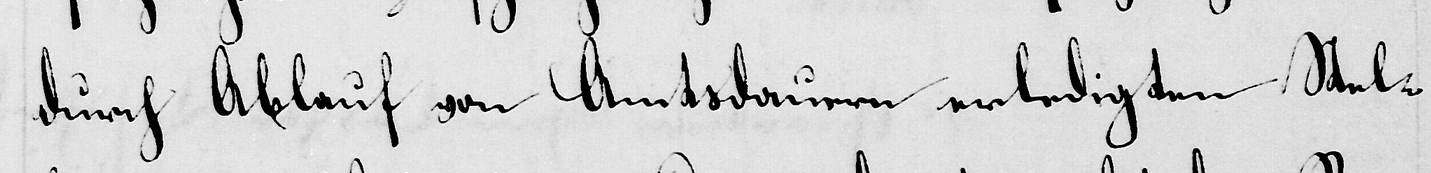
durch Ablauf von Amtsdauern erledigten Stel¬
